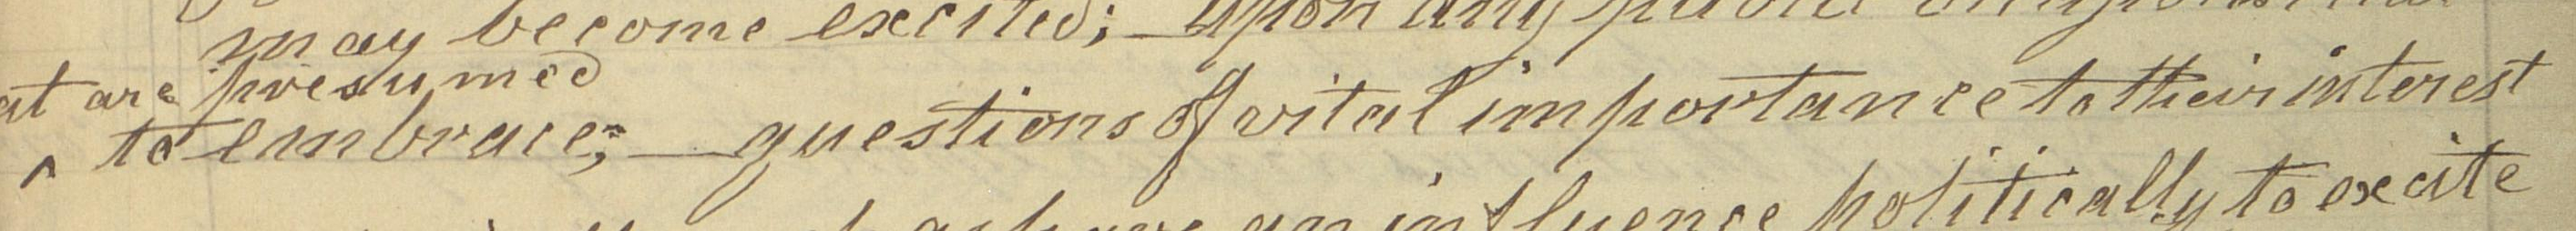to embrace; questions of vital importance to their interest
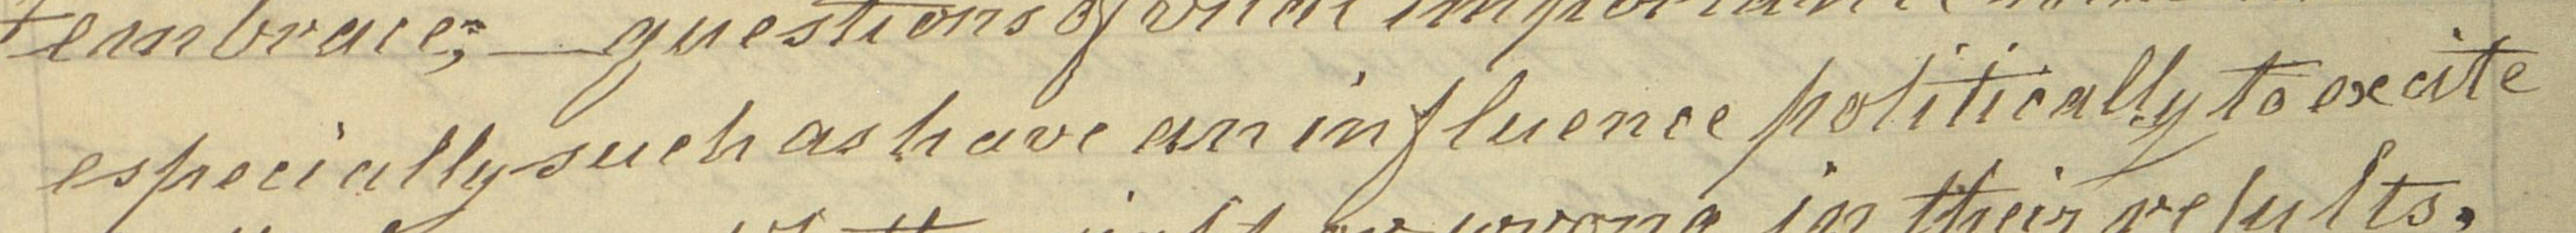especially such as have an influence politically to excite
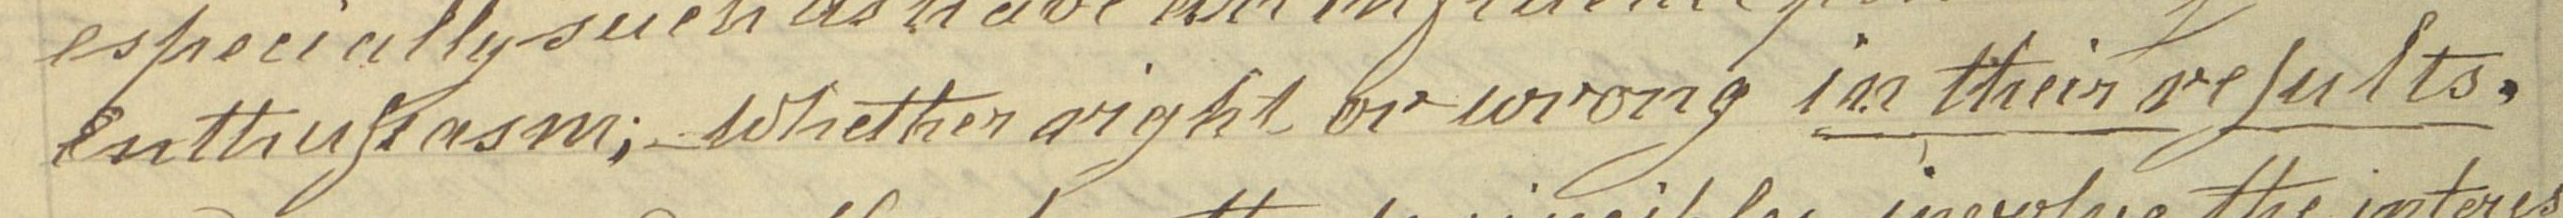Enthusiasm; whether right or wrong in their results.
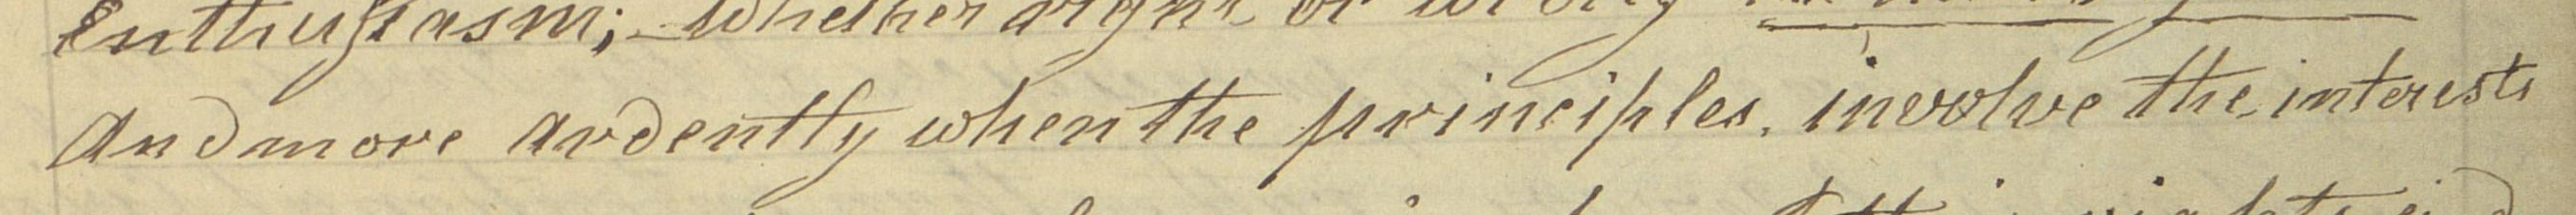And more ardently when the principles, involve the interests
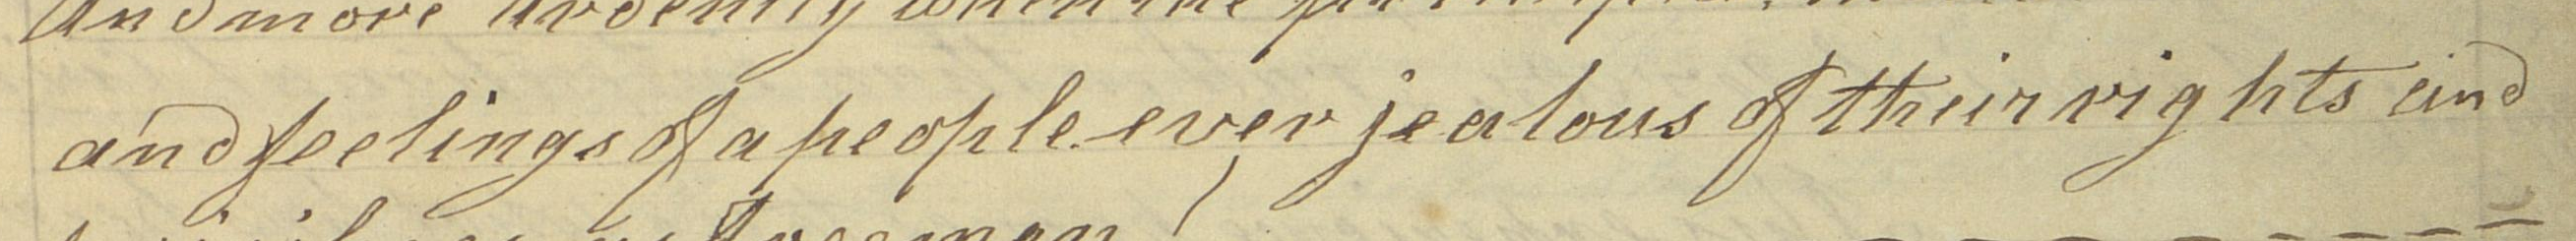and feelings of a people over jealous of their rights and
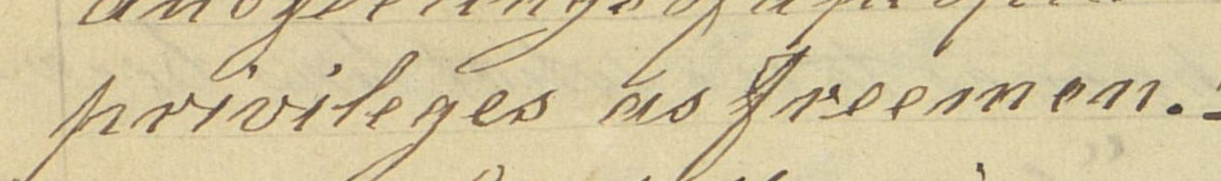privileges as freemen.
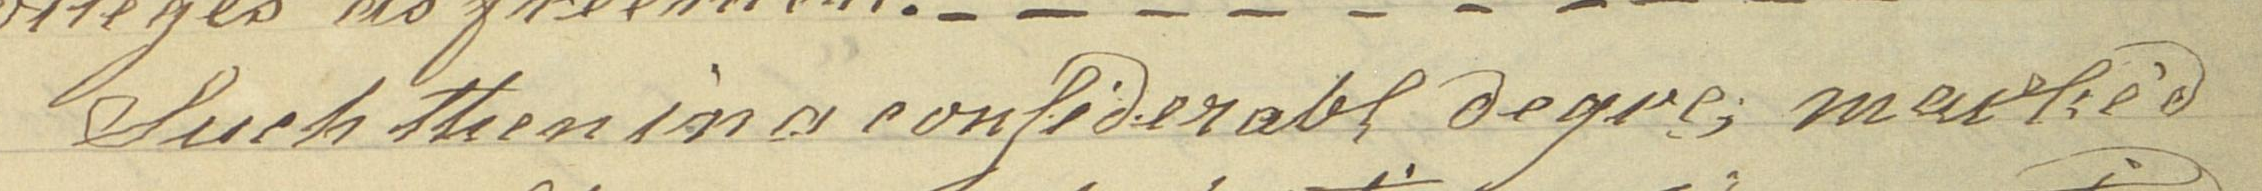Such then in a considerable degree; marhe'd
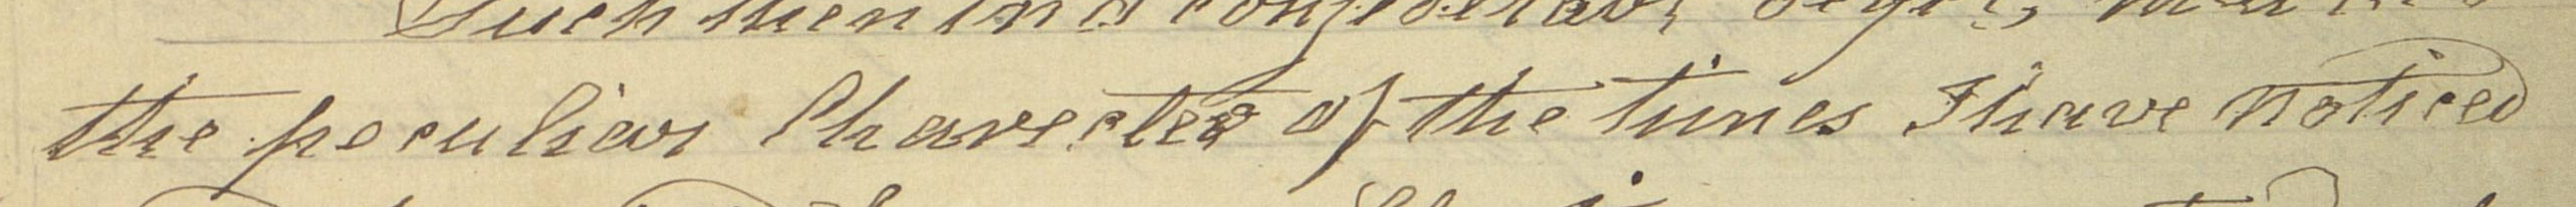the peculiar Character of the times I have noticed
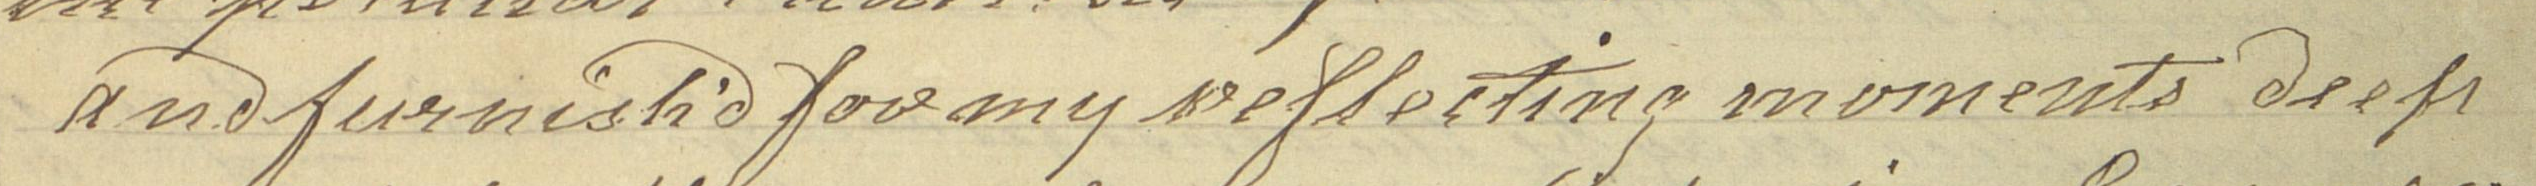and furnish'd for my reflecting moments deep
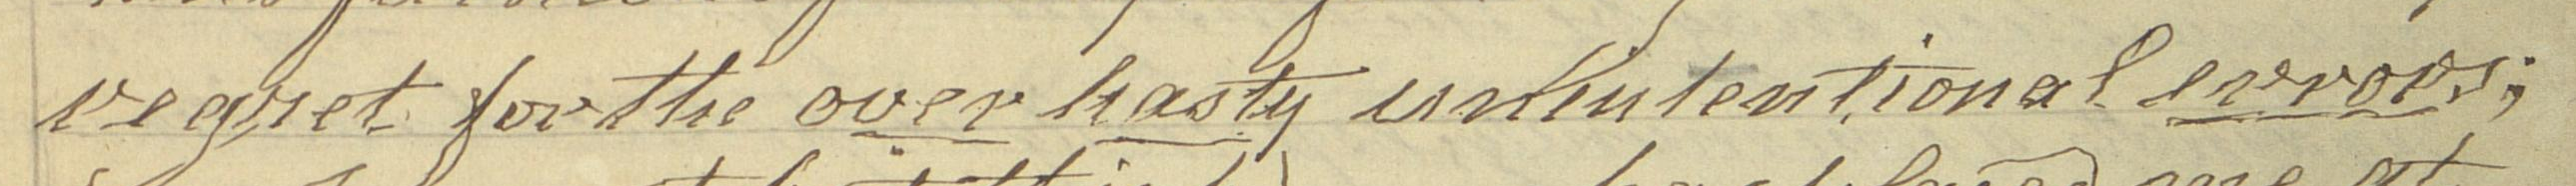regret for the over hasty unintentional errors:
